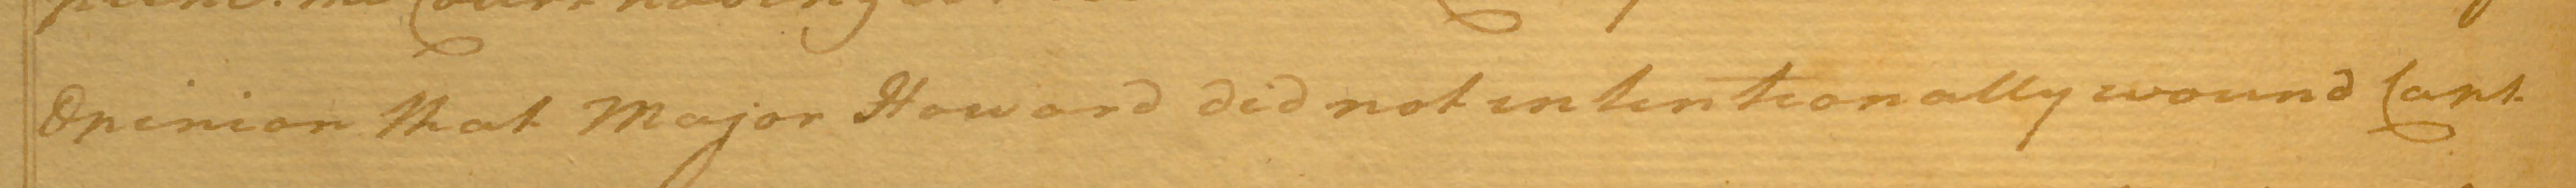Opinion that Major Howard did not intentionally wound Capt
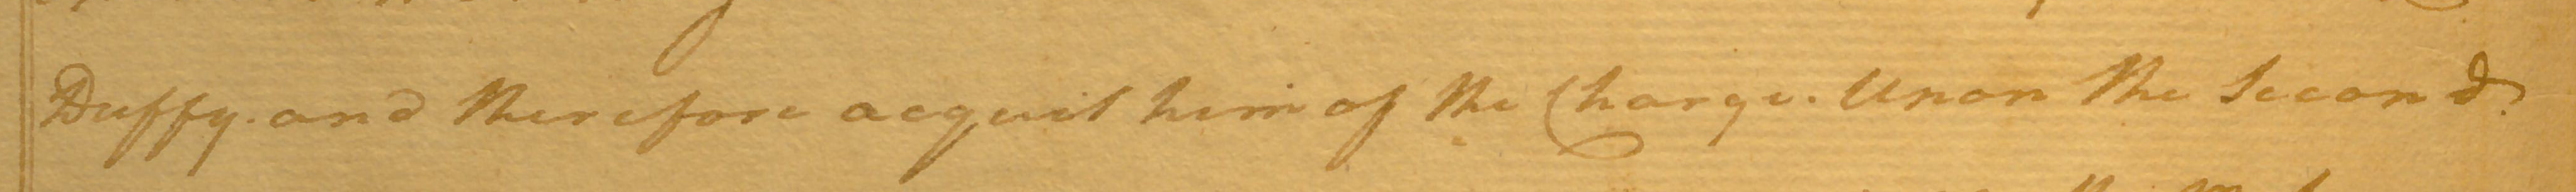Duffy and therefore acquit him of the Charge. upon the Second
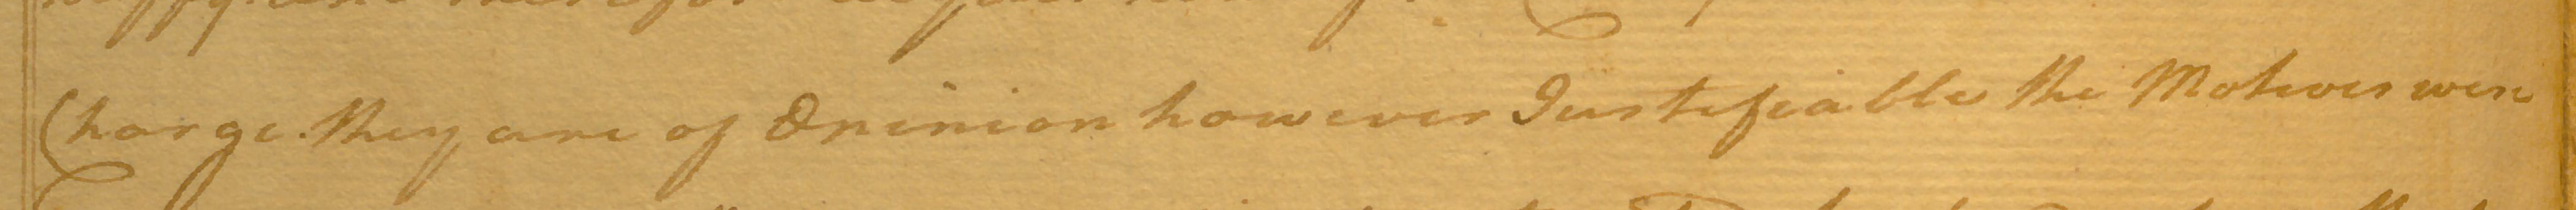Charge they are of Opinion however Justifiable the Motives were
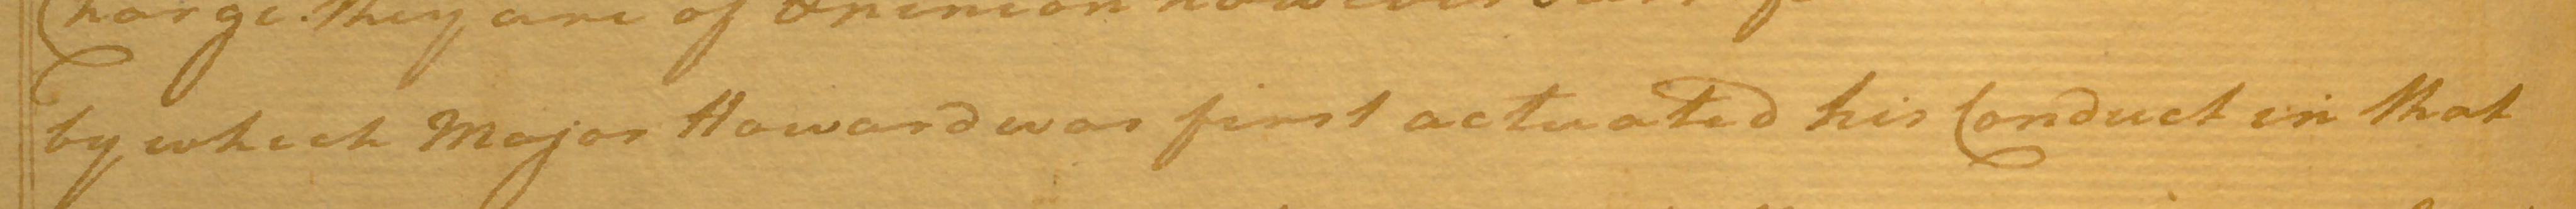by which Major Howard was first actuated his Conduct in that
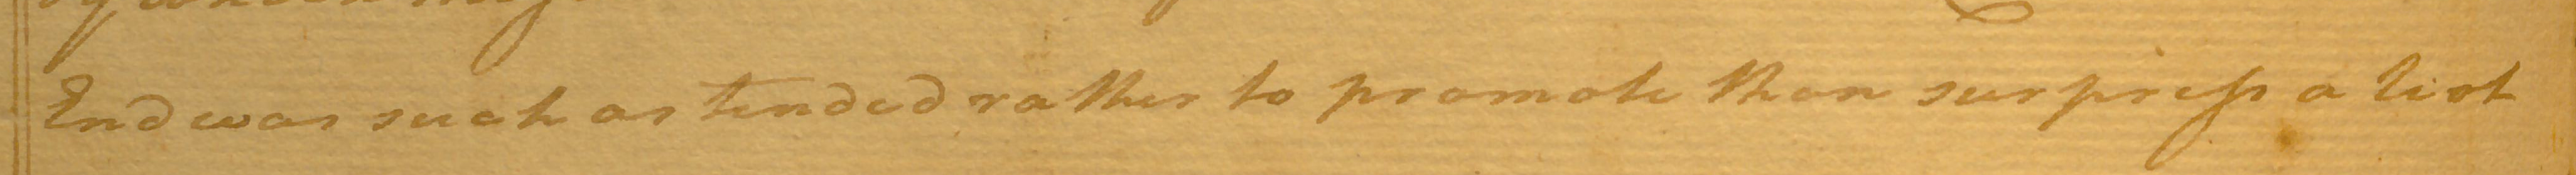End was such as tended rather to promote than surpress a riot
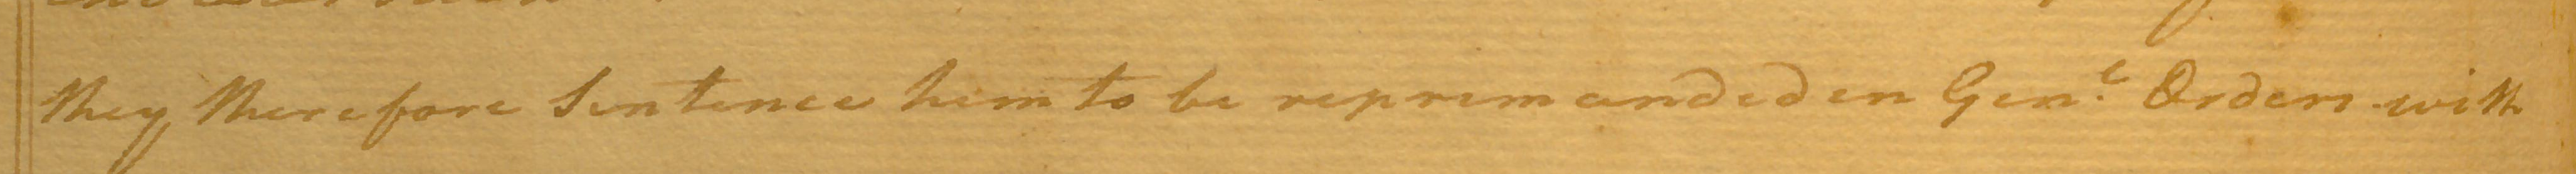they therefore sentence him to be reprimanded in Gen^l. Orders with
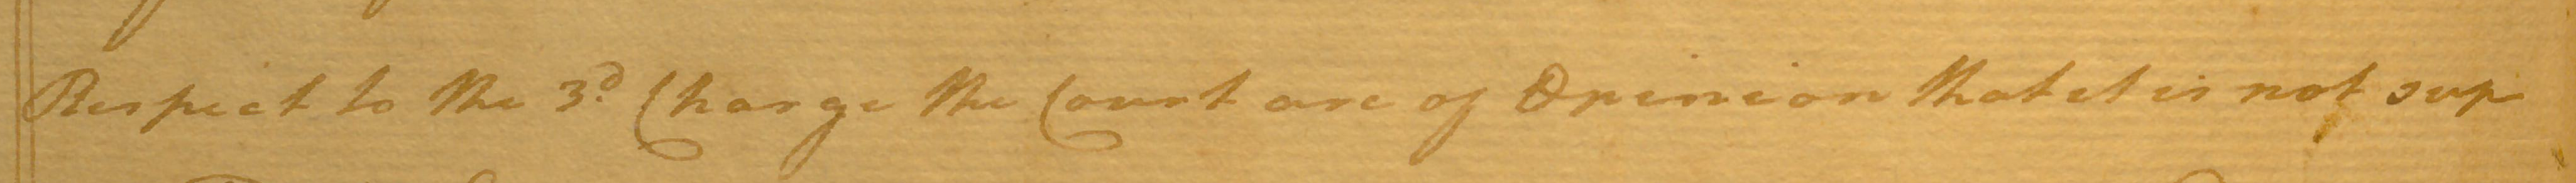Respect to the 3^d. Charge the Court are of Opinion that it is not sup
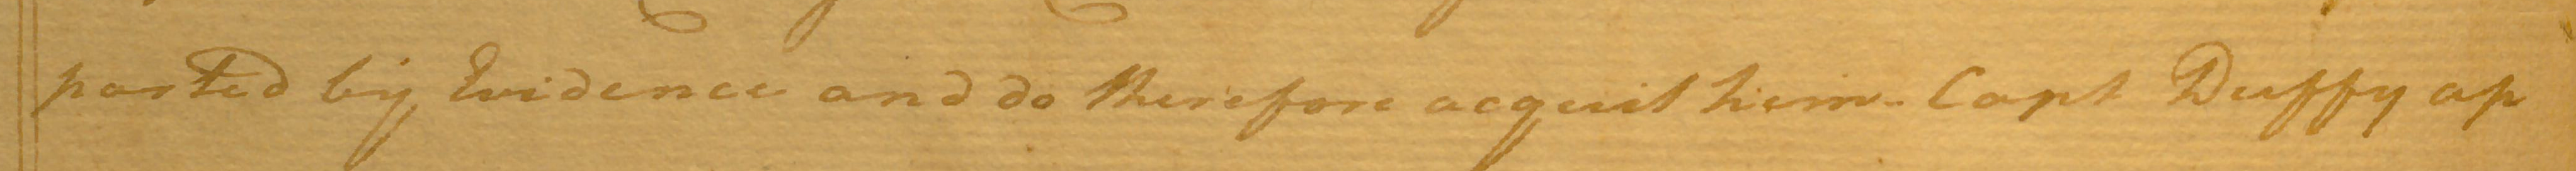ported by Evidence and do therefore acquit him. Capt Duffy ap
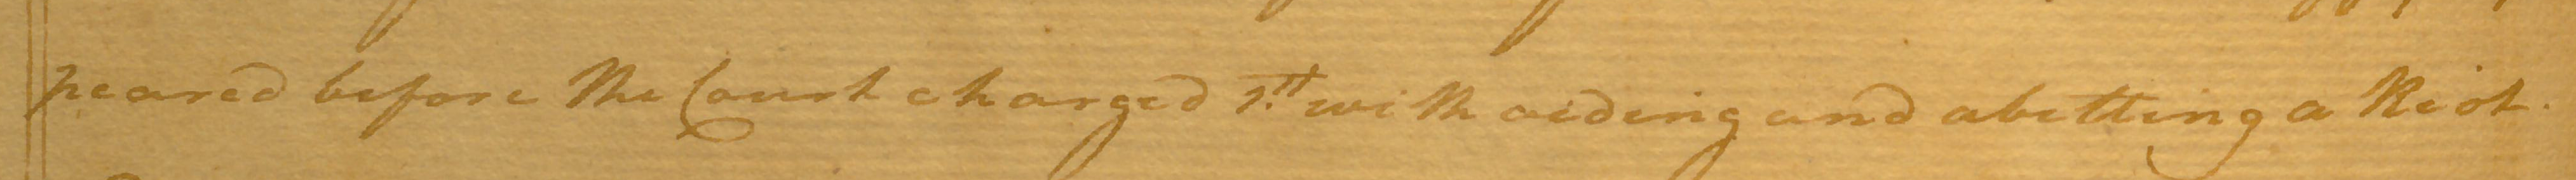peared before the Court charged 1^st. with aiding and abetting a Riot
